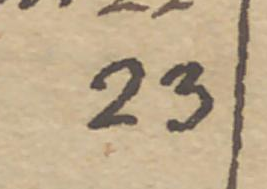23
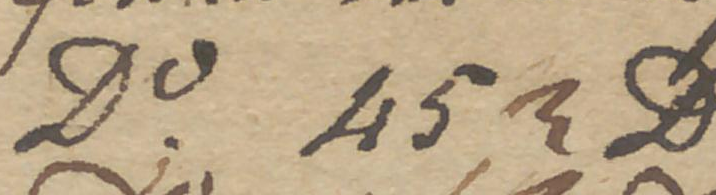D^o. 45 D
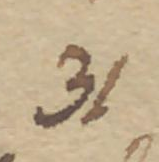31
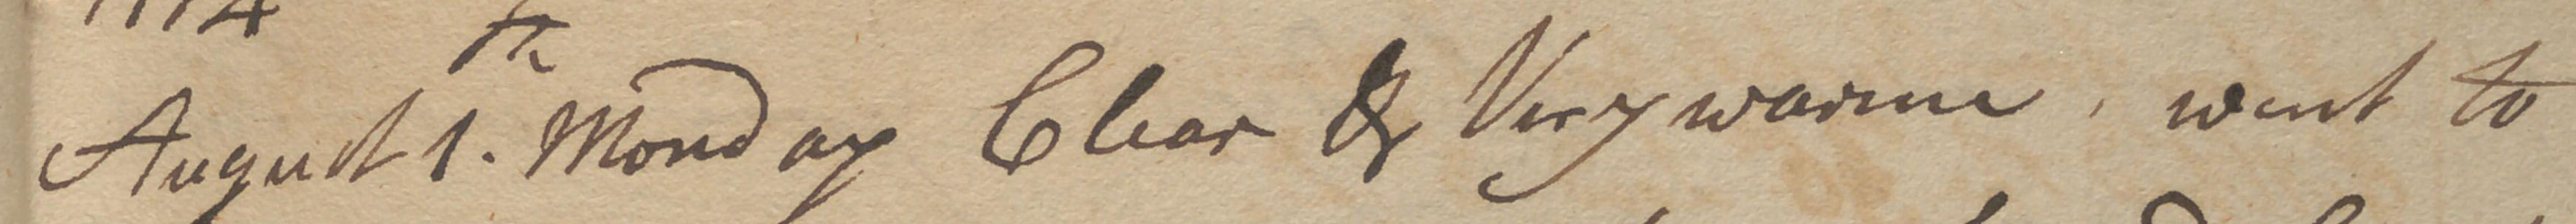August 1^th. Monday Clear & Very warme, went to
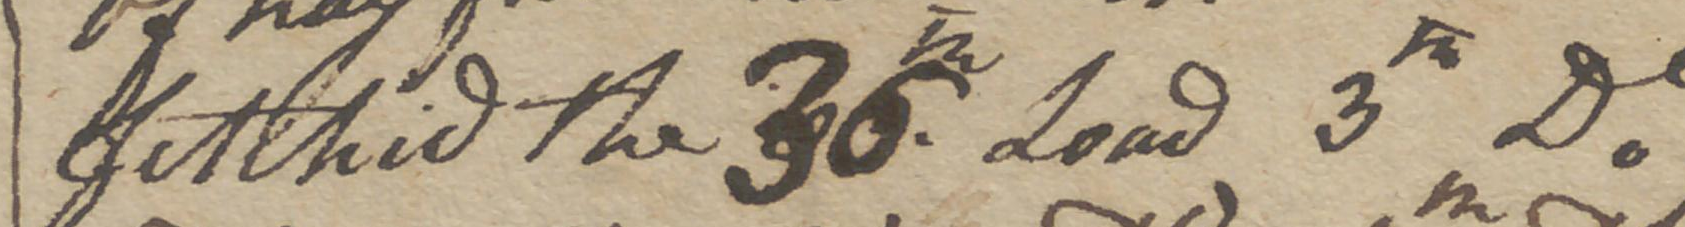fetched the 36^th. Load 3^th D^o.
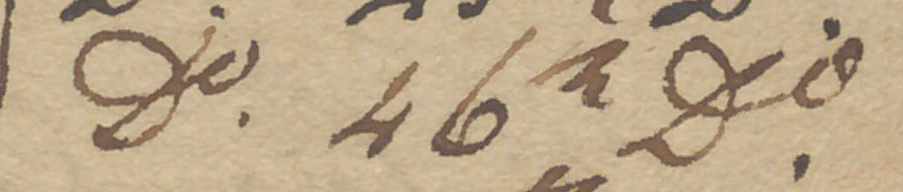D^o. 46^th D^o.
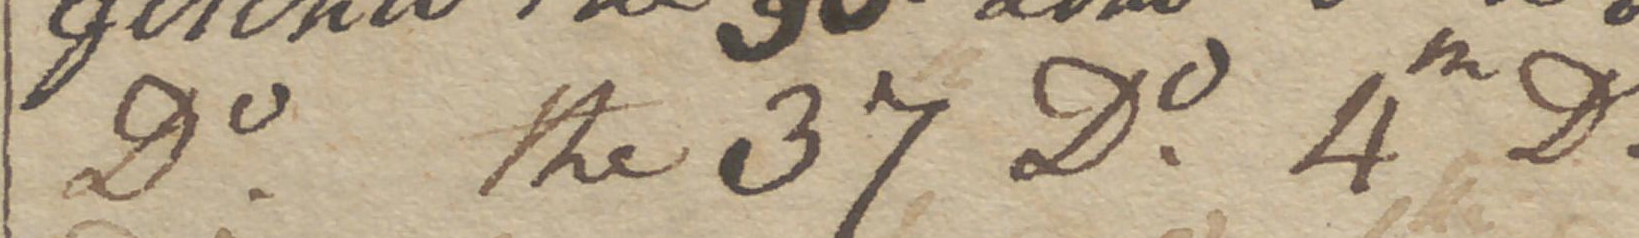D^o. the 37 D^o. 4^th D^o.
